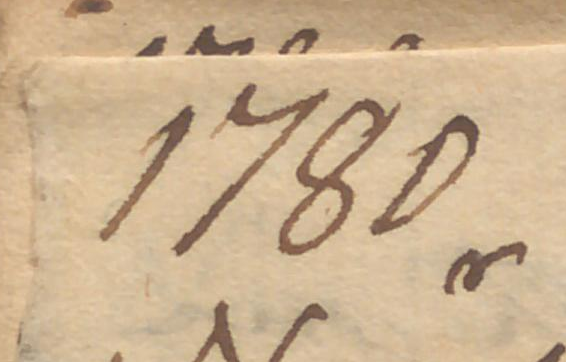1780
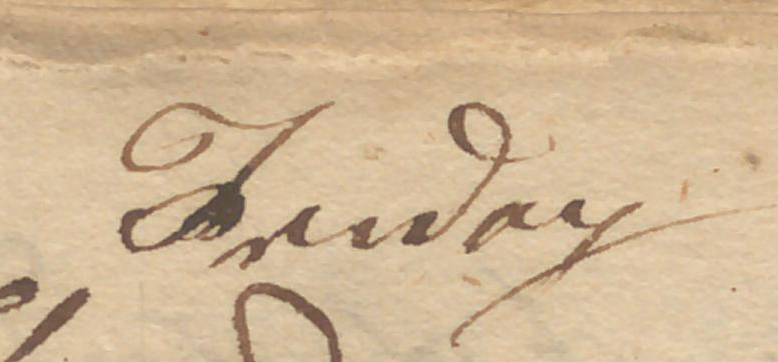Friday
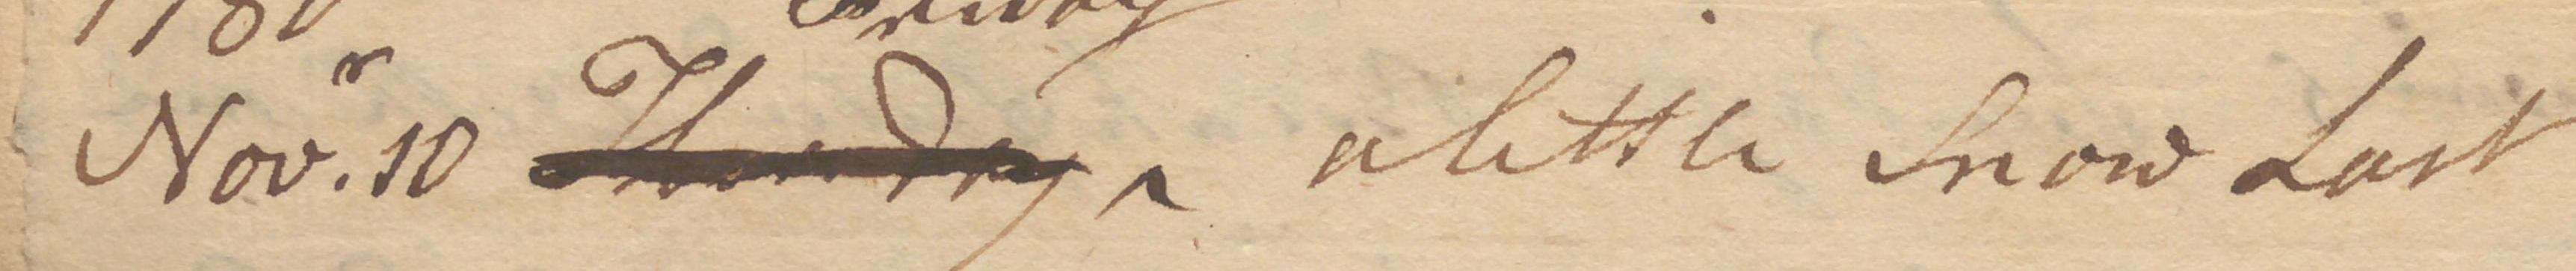Nor. 10 [Thursday] ^ a little snow Last
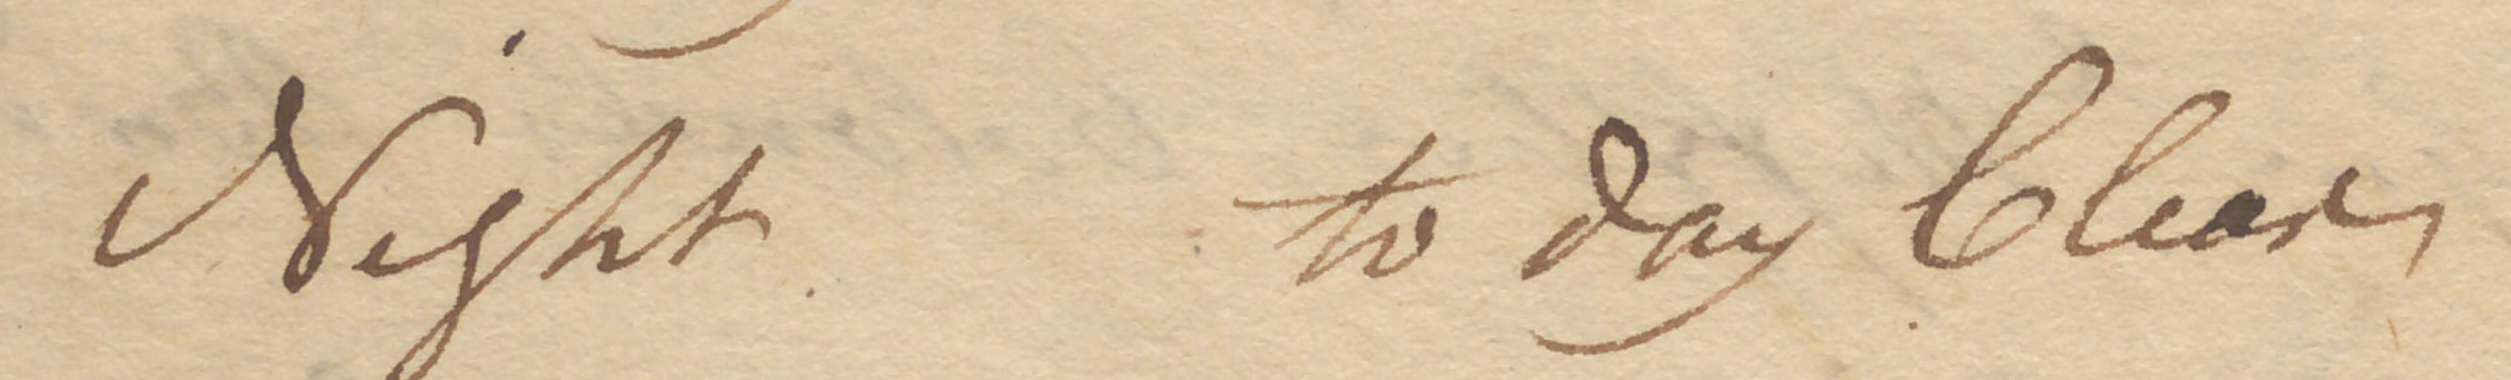Night to day Clear
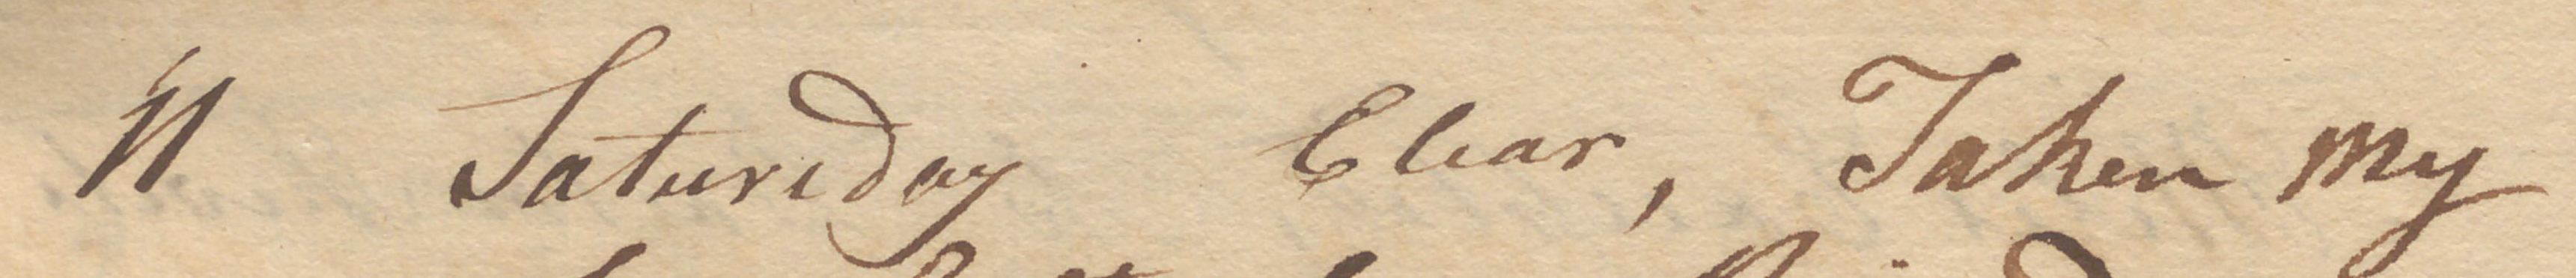11 Saturday Clear, Taken My
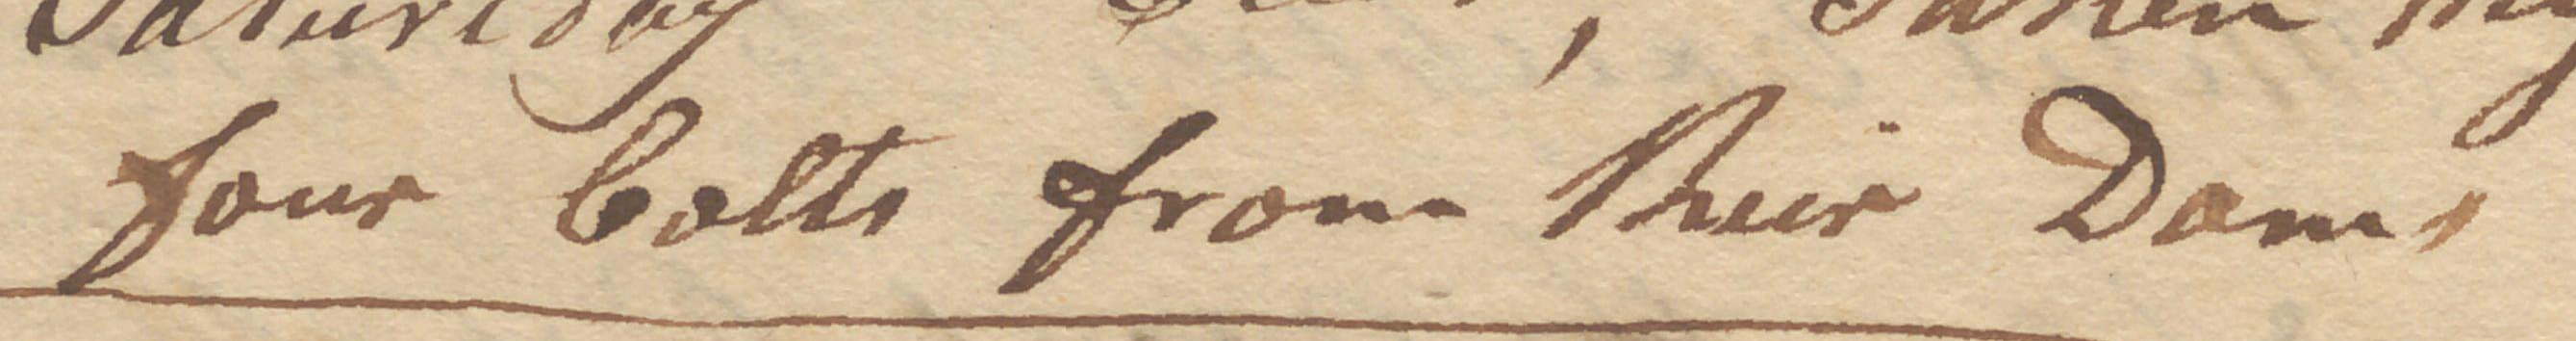four Colts from their Dams
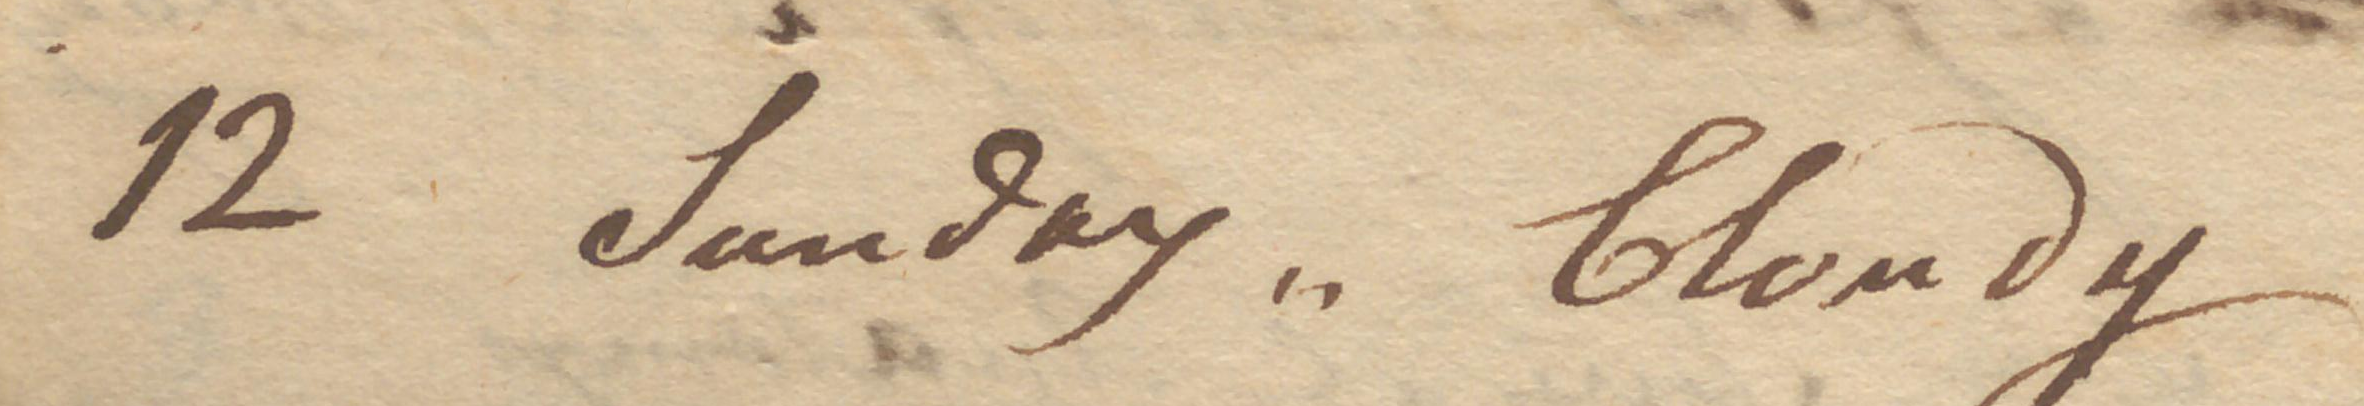12 Sunday.. Cloudy
